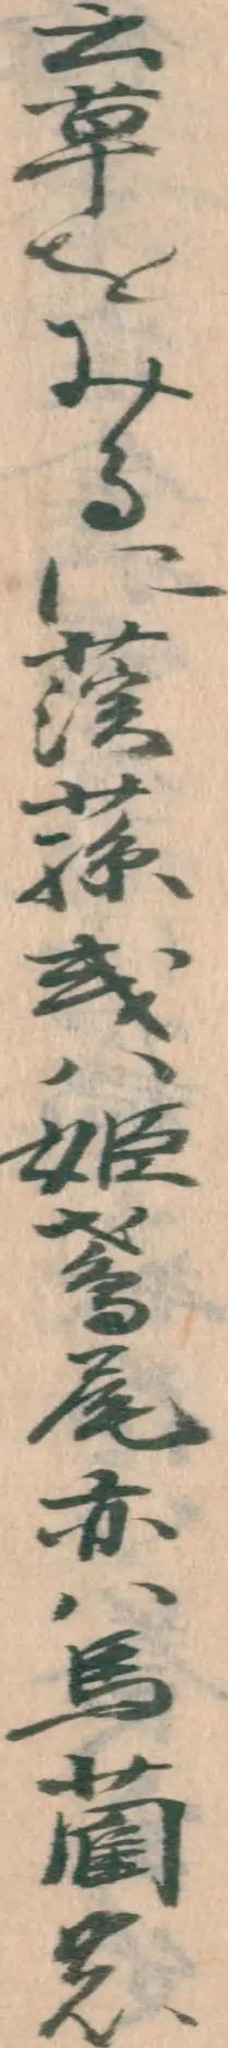云草をみるに渓蓀或は姫鳶尾亦は馬蘭の
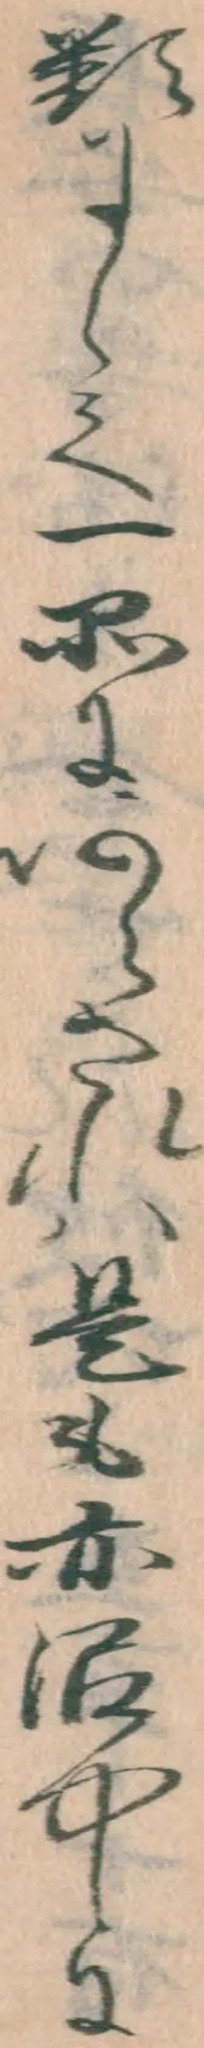類にして一品にあらされは是も亦沼中に
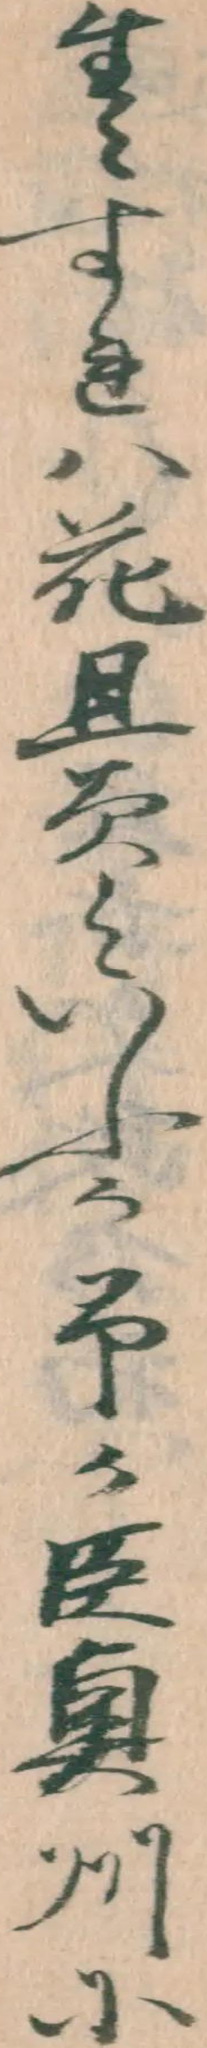生々すれは花且美といふか予か臣奥州に
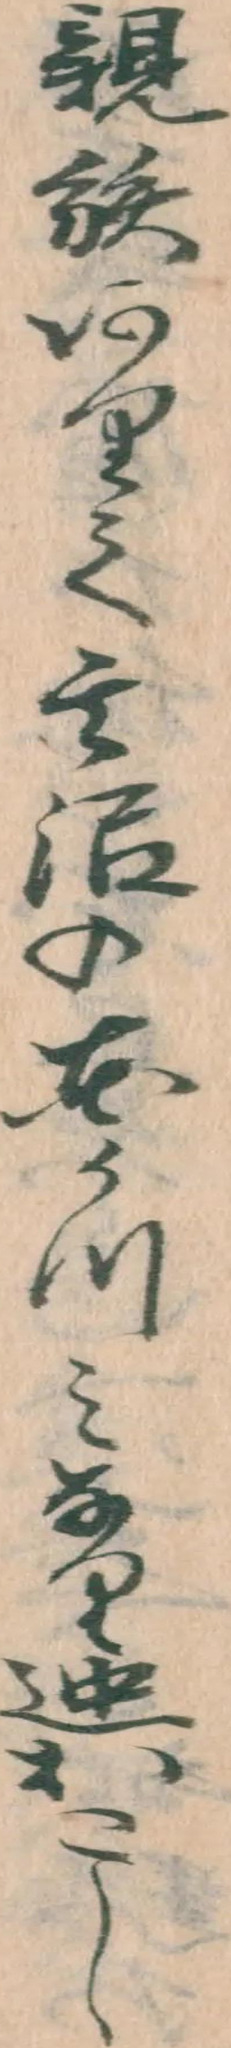親類ありて其沼の花うつみなり迚おこし
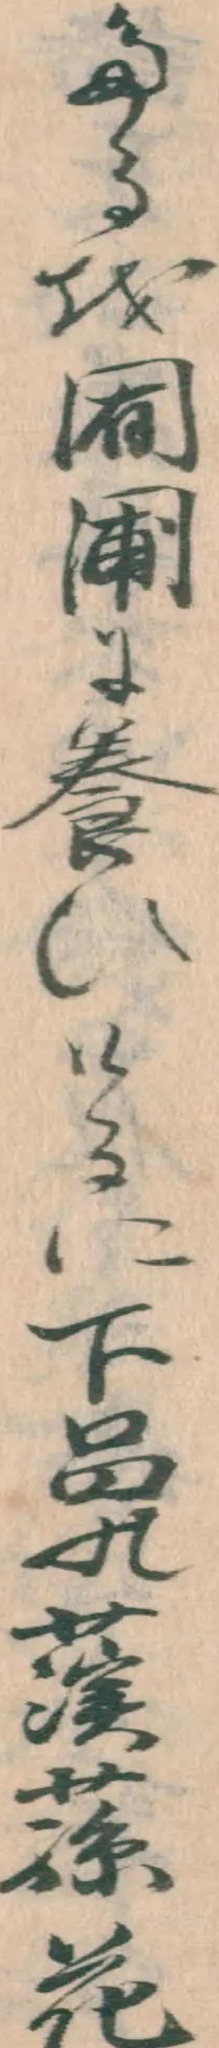たるを囿圃に養ひけるに下品の渓蓀花
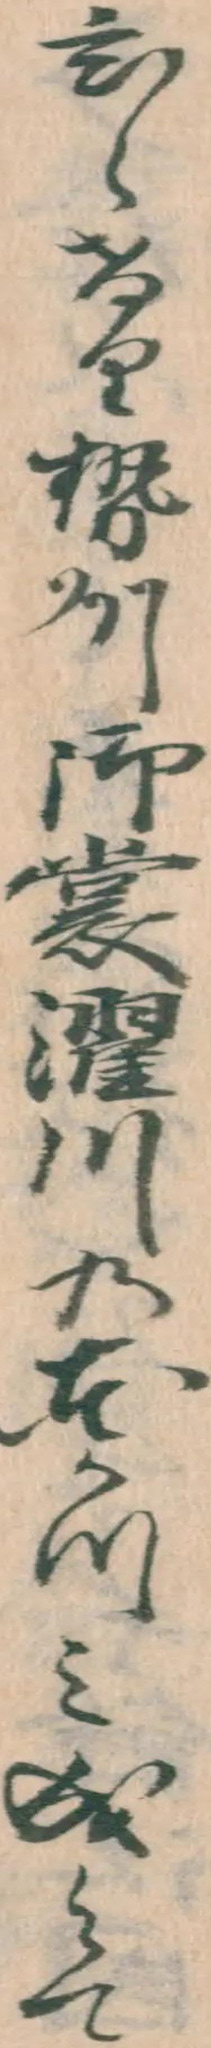ひらけり勢州御裳濯川の花かつみ成とて
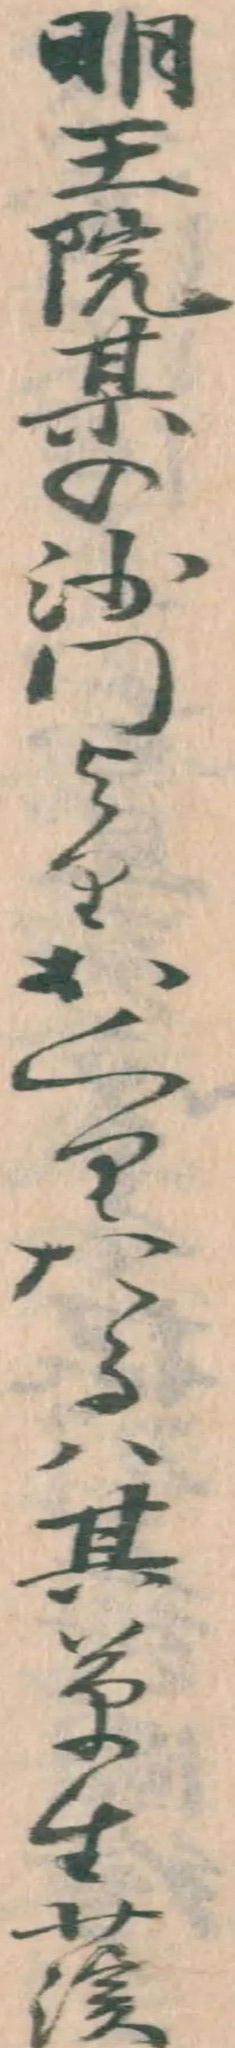明王院某の沙門よりおくりたるは其草生渓
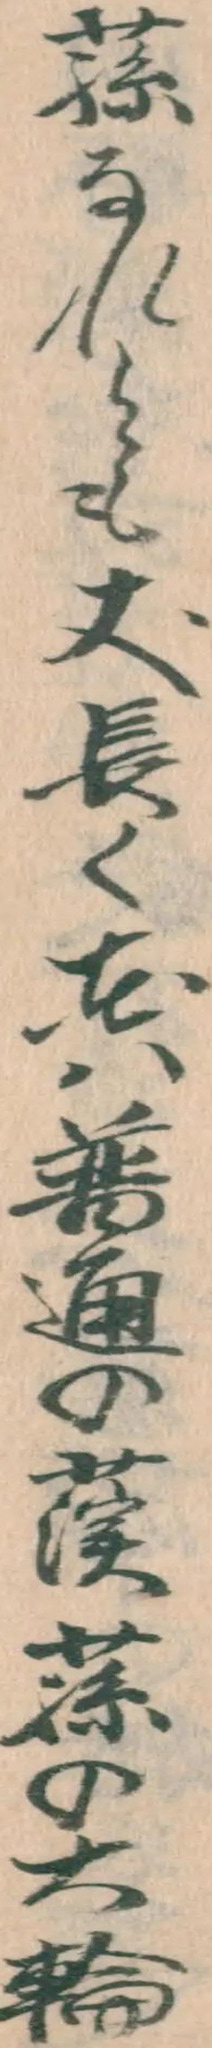蓀なれとも丈長く花は普通の渓蓀の大輪
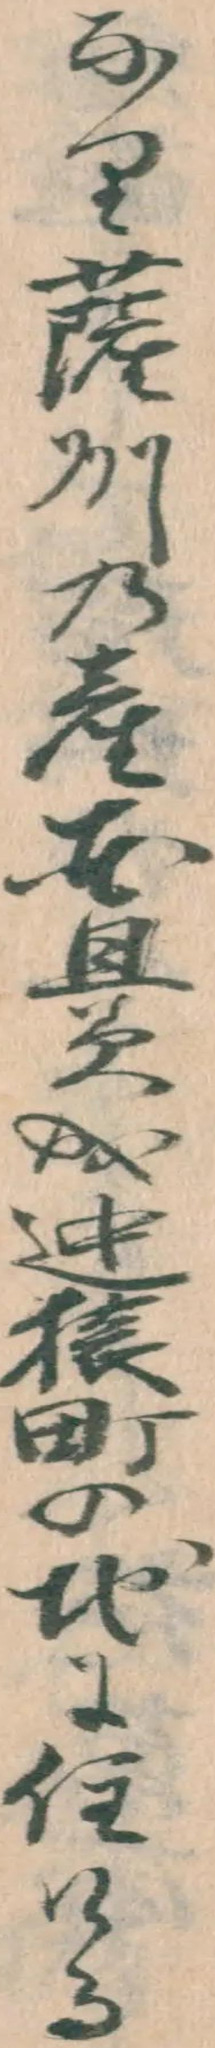なり薩州の産花且美成迚猿町の地に住ける
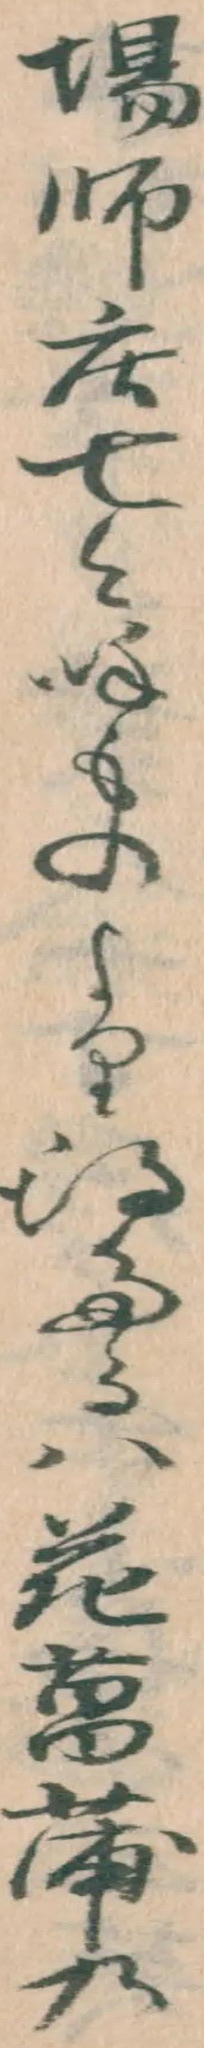場師庄七と呼ものより得たるは花菖蒲の

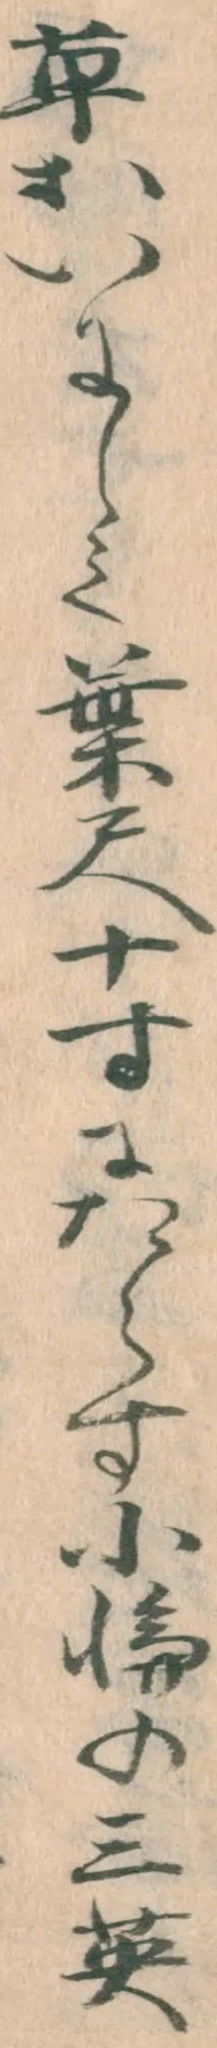草いにして葉尺十寸にたらす小輪の三英
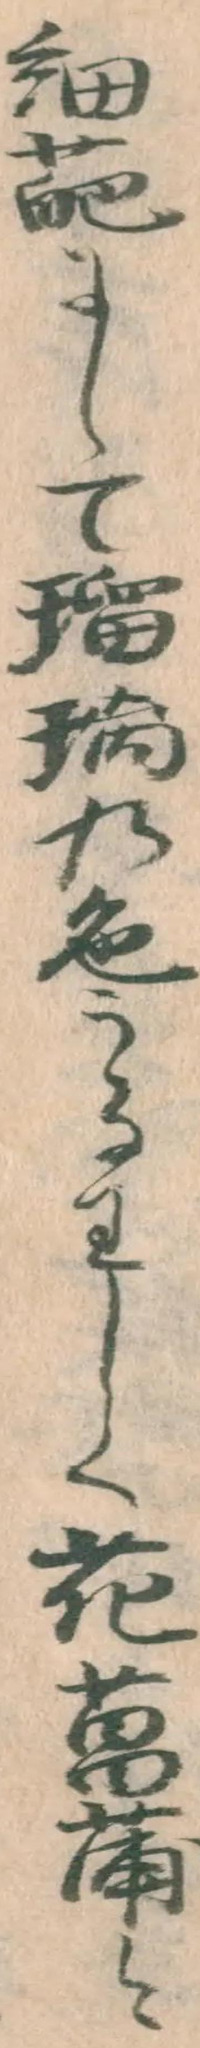細葩にして瑠璃の色うるわしく花菖蒲と
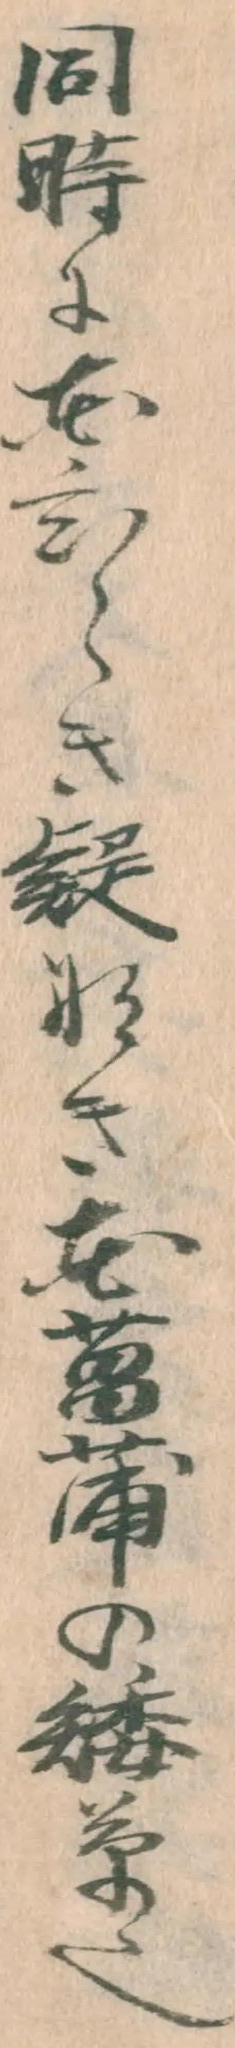同時に花ひらき疑なき花菖蒲の矮草也
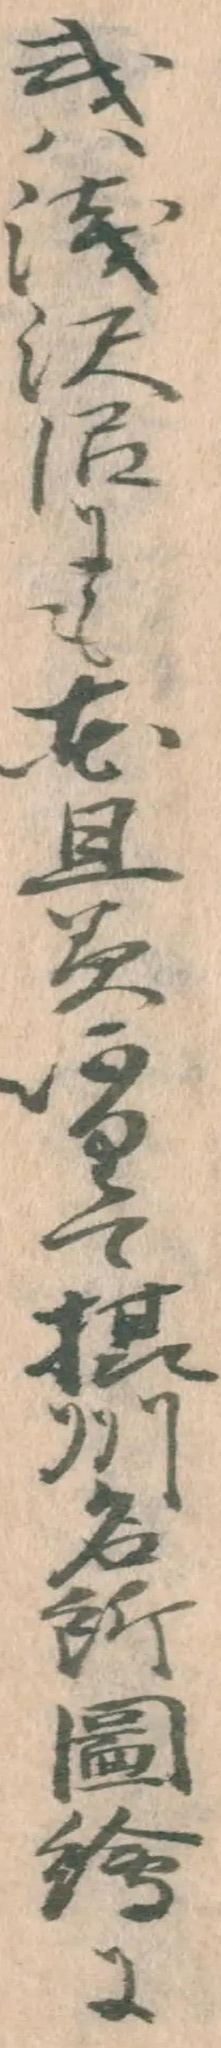或は浅沢沼にも花且美ありて摂州名所図絵に
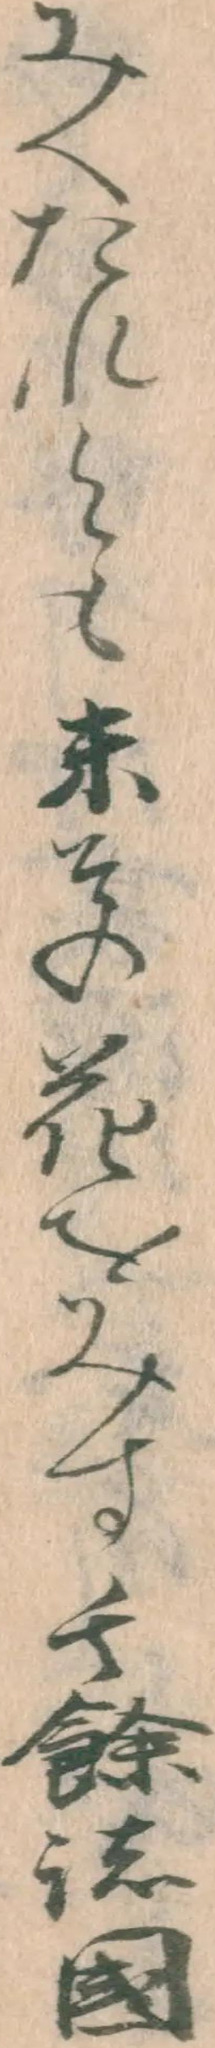みへたれとも未その花をみす千余諸国
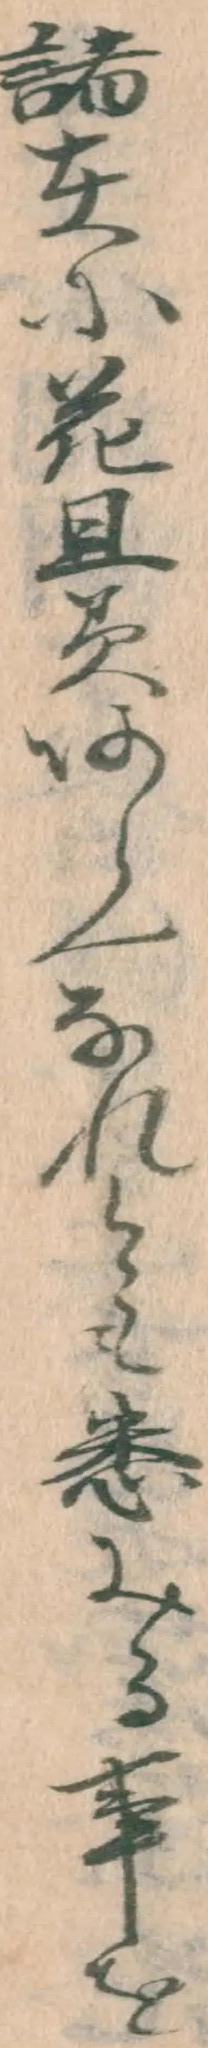諸在に花且美あらんなれとも悉みる事を
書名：花菖培養録
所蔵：国立国会図書館 National Diet Library, JAPAN
